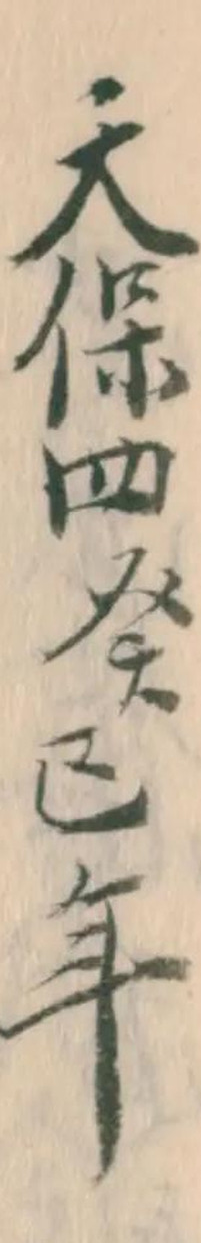天保四癸巳年
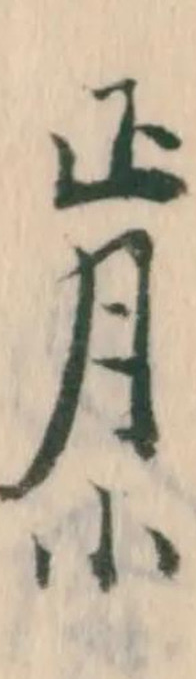正月小
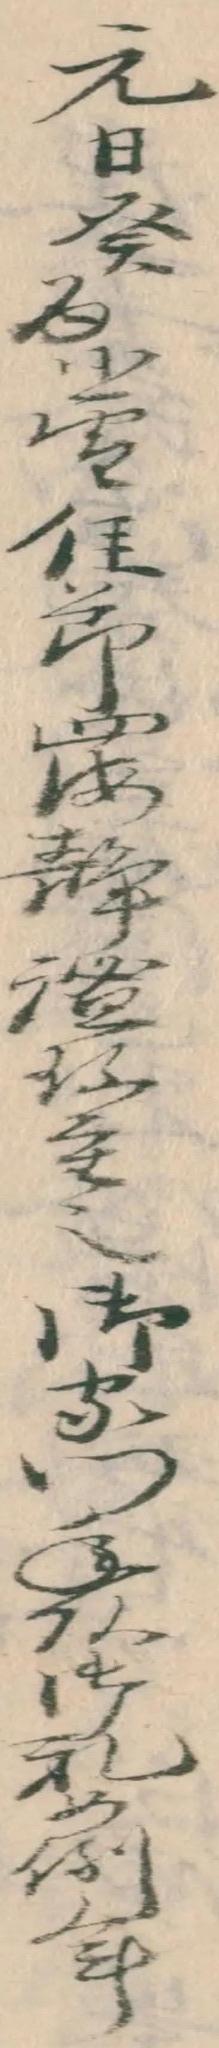元日癸酉小雪佳節四海静謐弥重也御家門年頭御礼如例年
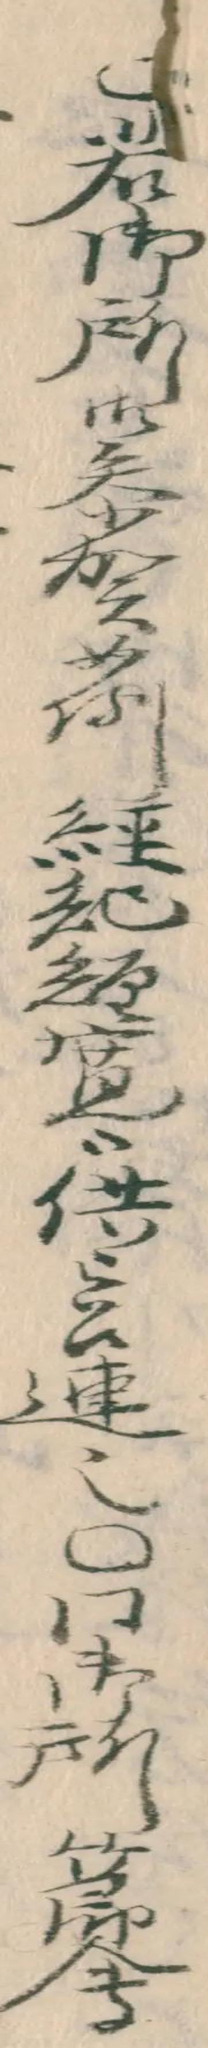○若御所御参賀如例経紀経寛御供被召連也○同御所節會
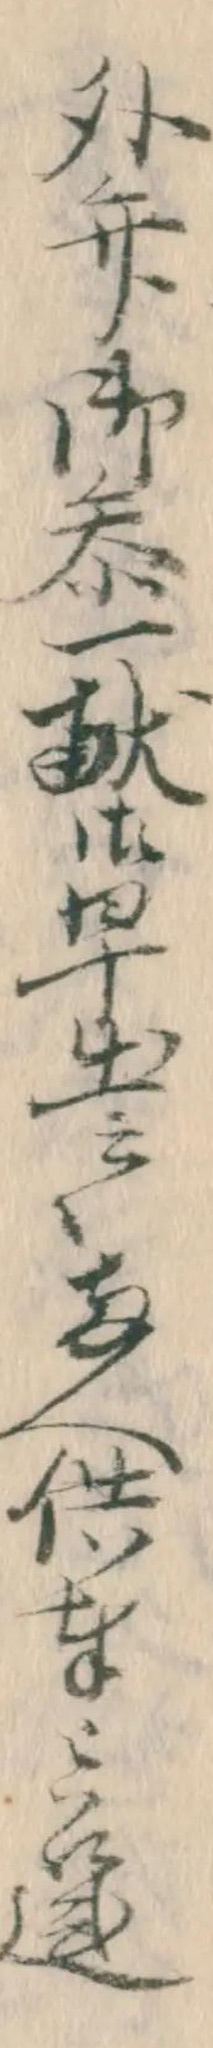外弁御参一献御早出云々両人供奉被召連
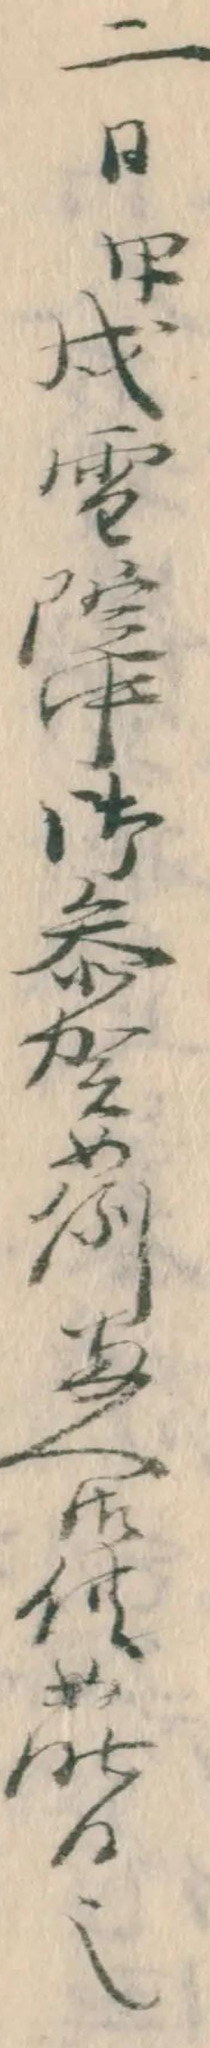二日甲戌雪院中御参賀如例両人御供如昨日也
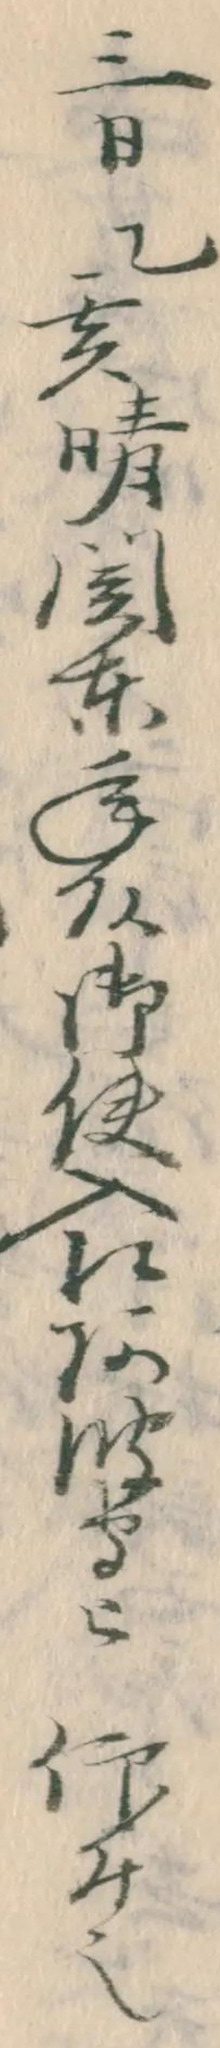三日乙亥晴関東年頭御使入江阿波守被仰付也
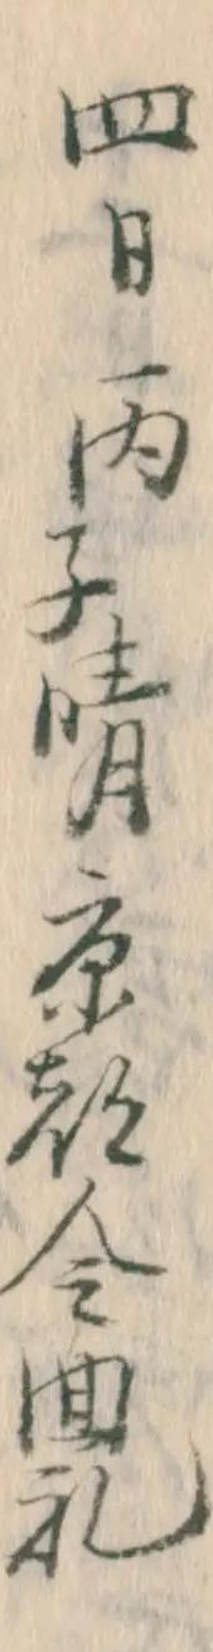四日丙子晴京都令回礼
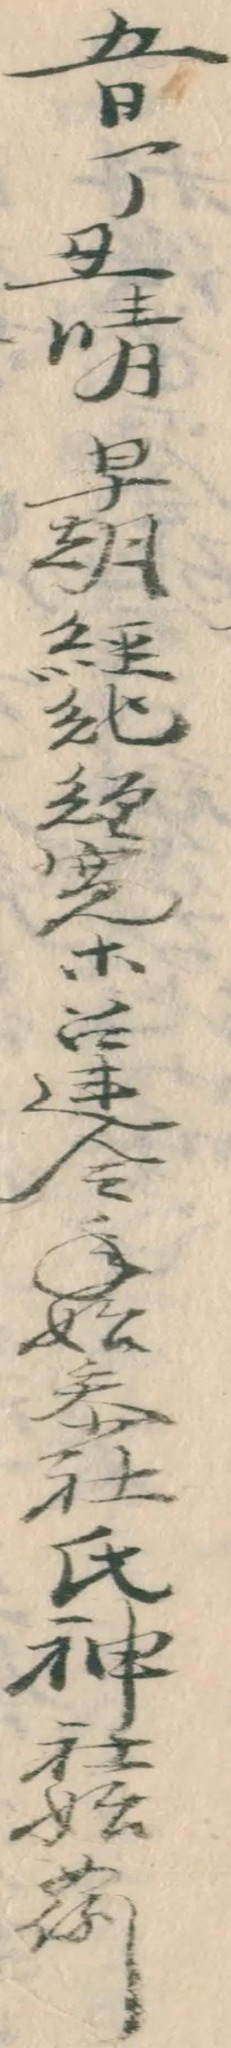五日丁丑晴早朝経紀経寛等召連金年始参社氏神社始如例
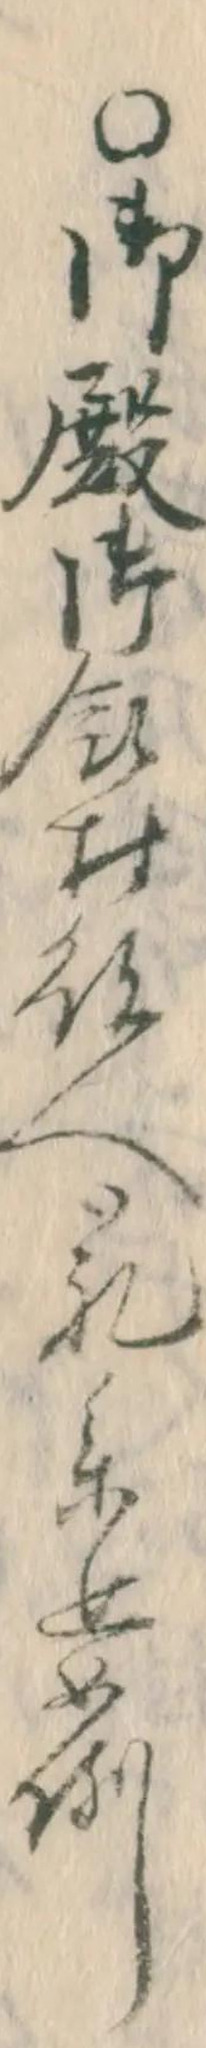○御殿御領村役人御礼参上如例
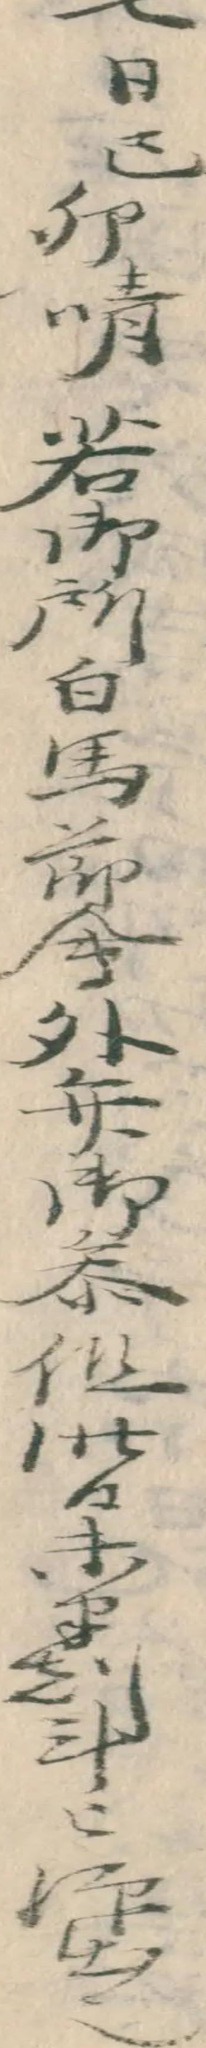七日己卯晴若御所白馬節會外弁御参但昨日未申刻斗被仰出也
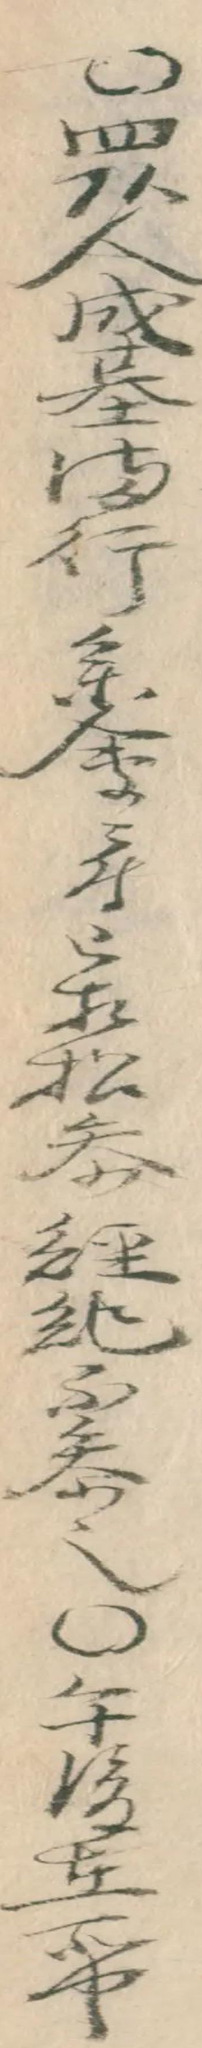○四頭人成基満行参會ニ付被相招参経紀不参也○午後在所中

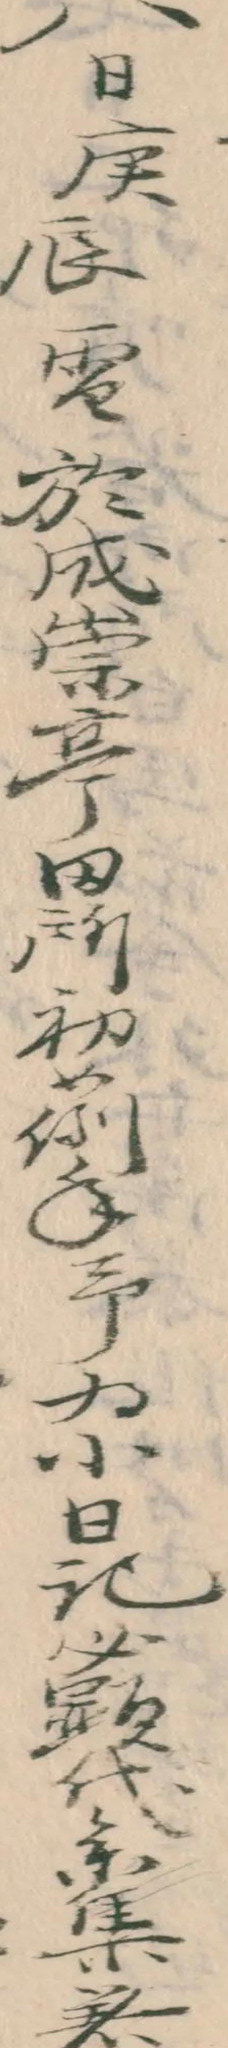八日庚辰雪於成崇亭田所初如例年予為小日記必顕代参集着
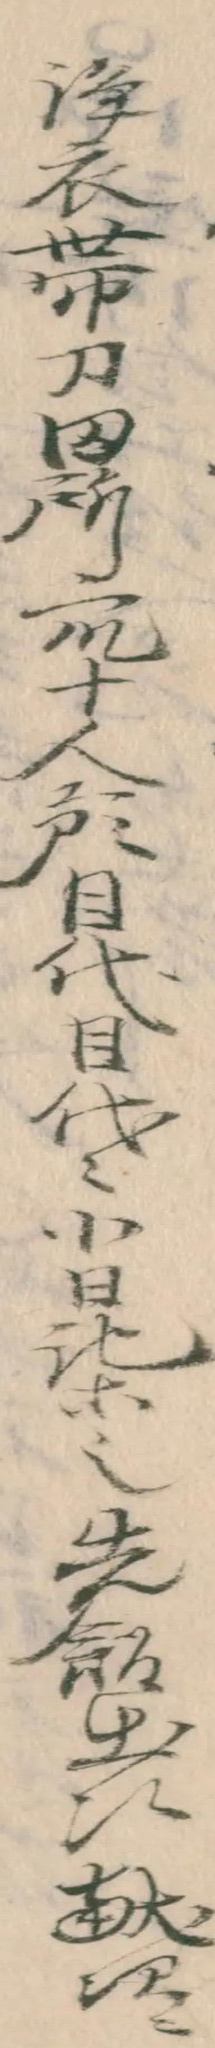浄衣帯刀田所衆十人預目代目代々小日記等也先飯出次献次ニ
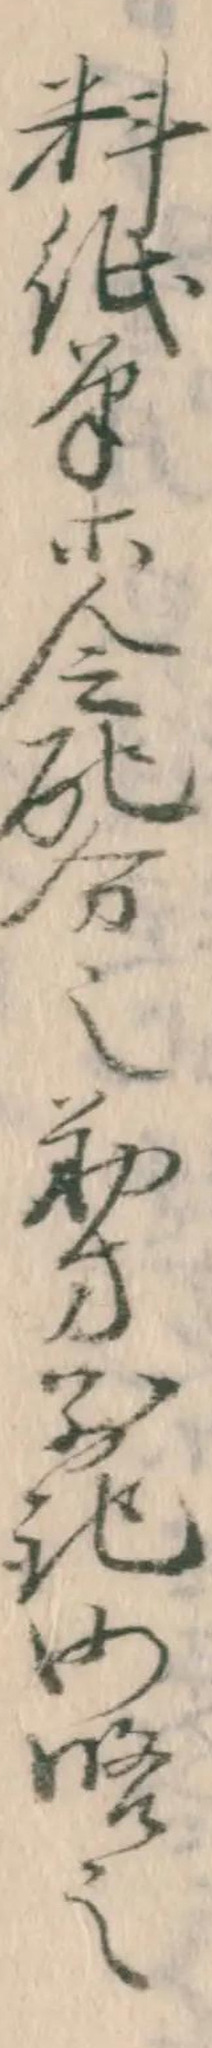料紙筆等令配分也勤方別記仍略之
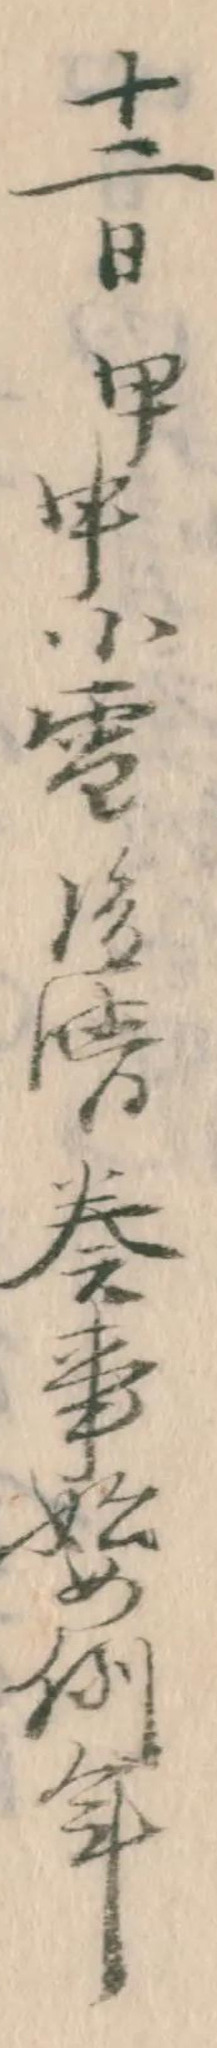十二日甲申小雪後晴奏事始如例年
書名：賀茂社記録. 第66冊
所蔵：国立国会図書館 National Diet Library, JAPAN
